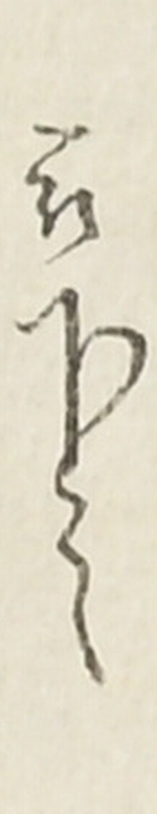被下之
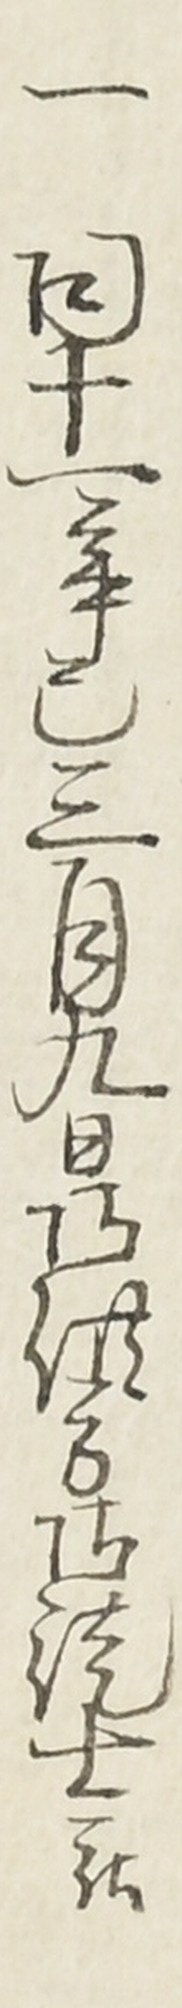一同十一辛巳三月九日御供方御徒士被
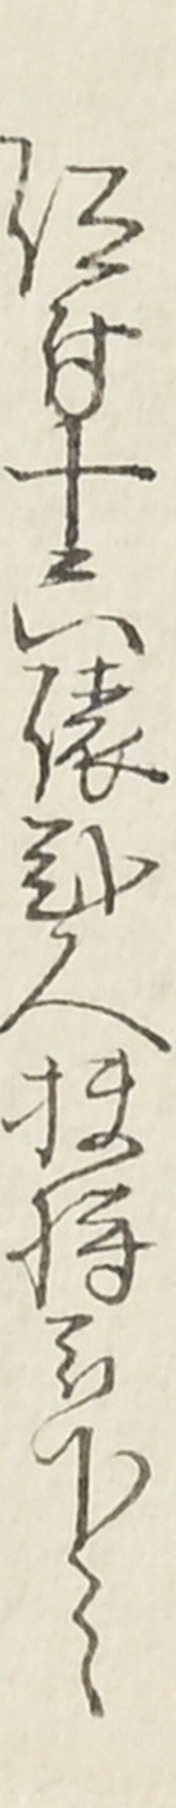仰付十六俵弐人扶持被下之
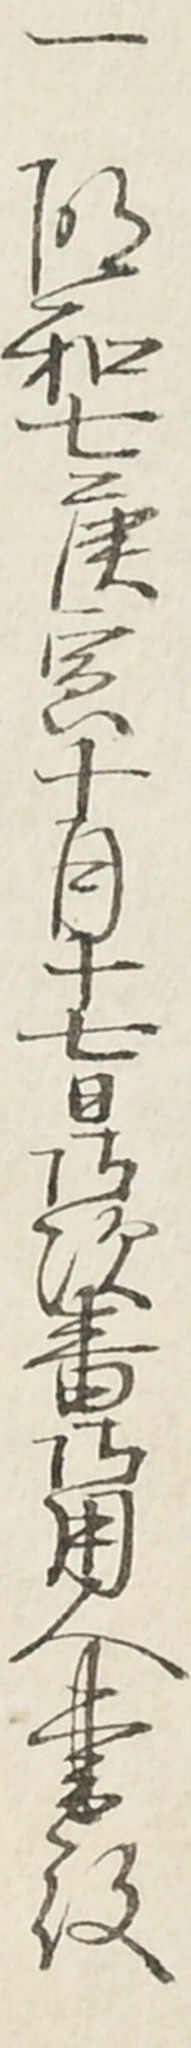一明和七庚寅十月十七日御次番御用人書役
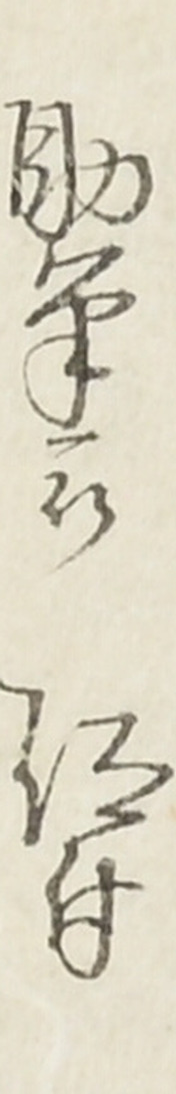助筆被仰付
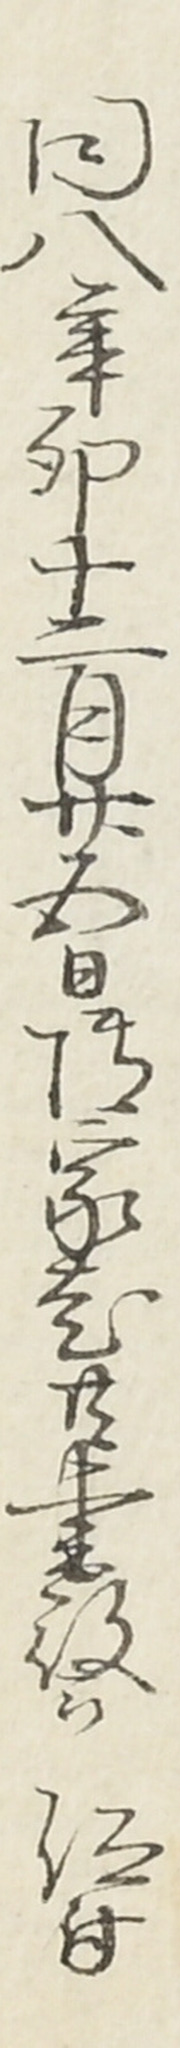一同八辛卯十二月廿五日御家老共書役被仰付
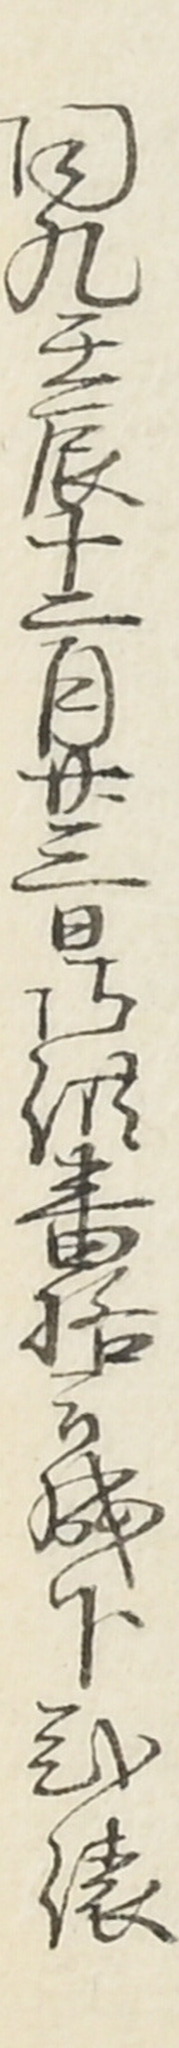一同九壬辰十二月廿三日御供番格被成下弐俵

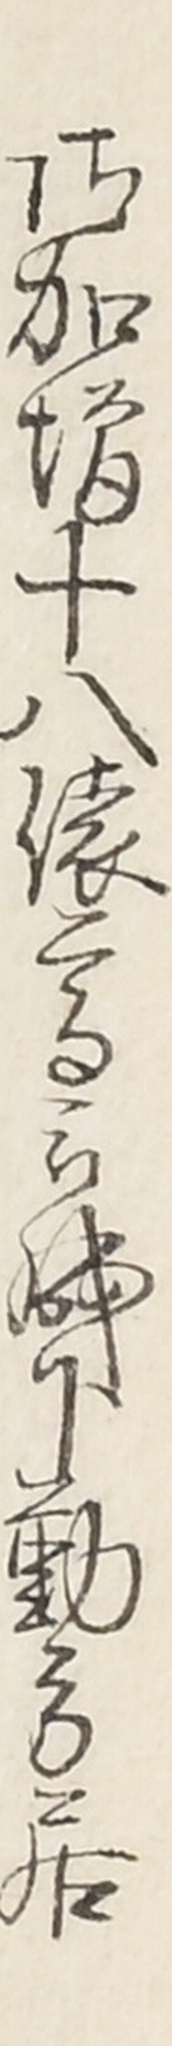御加増十八俵高被成下勤方居
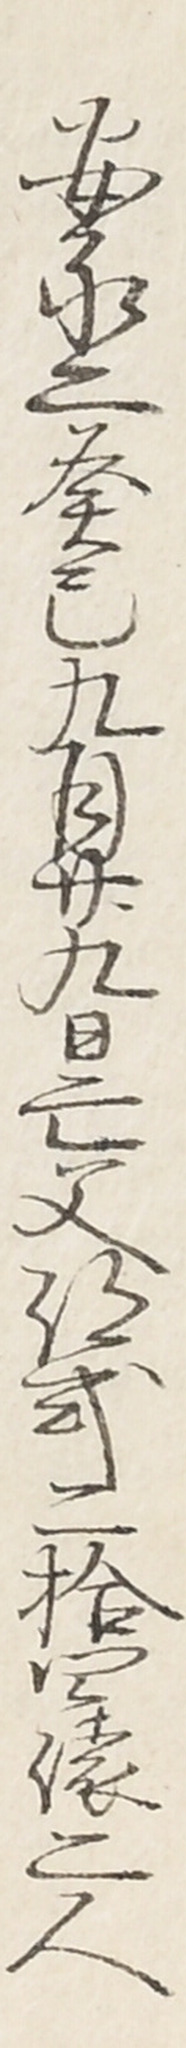一安永二癸巳九月廿九日亡父跡式二拾四俵二人
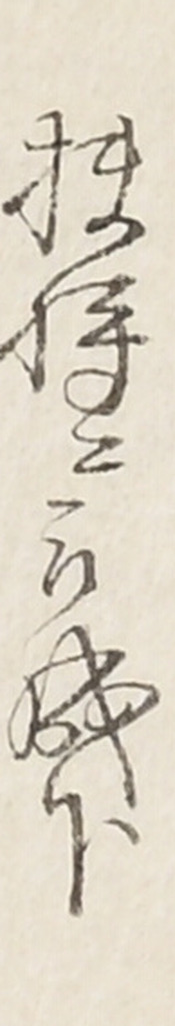扶持ニ被成下
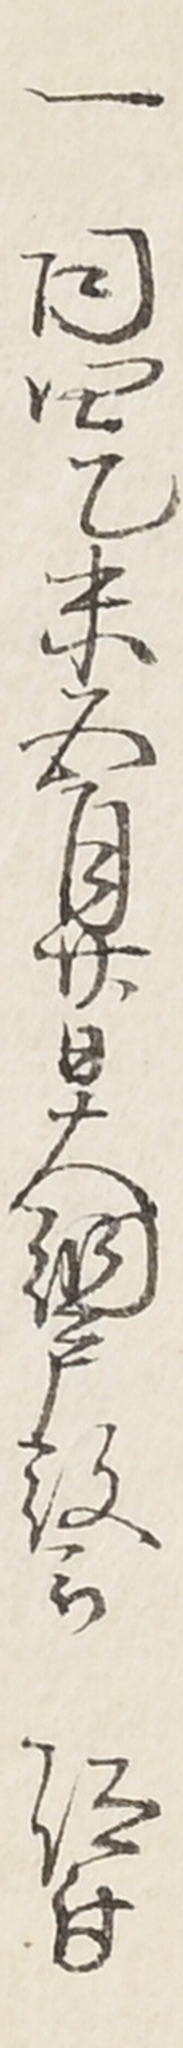一同四乙未五月廿日大納戸被仰付
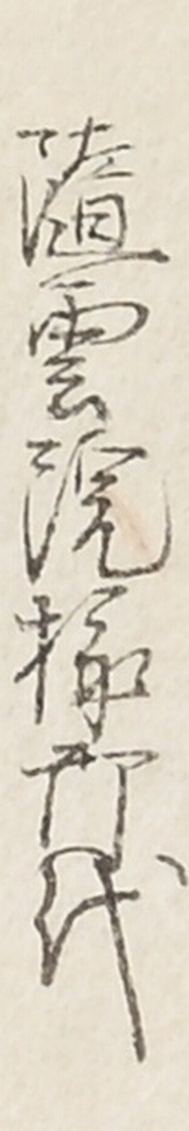随雲院様御代
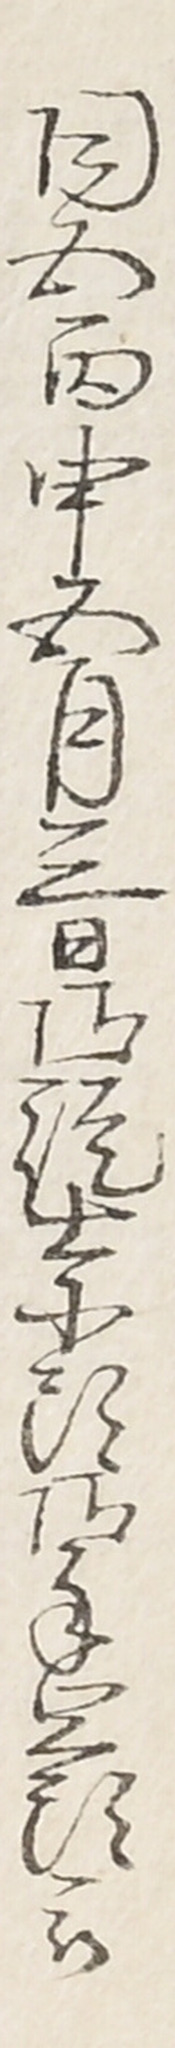一同五丙申五月三日御徒士小頭御手廻頭被
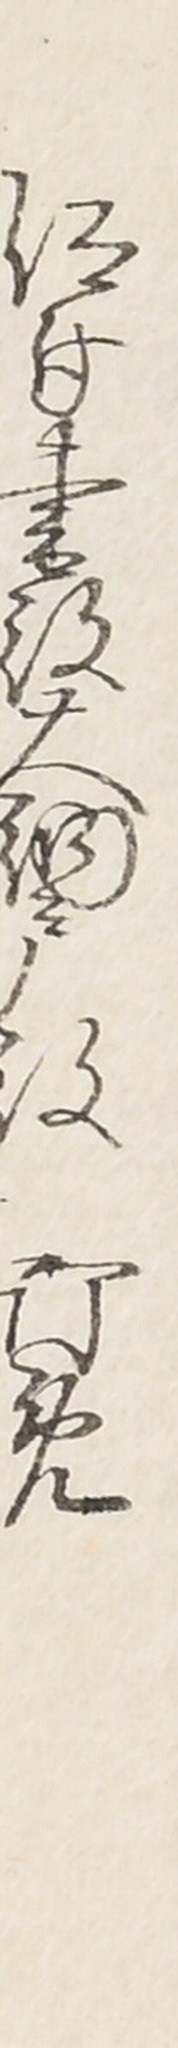仰付書役大納戸役御免
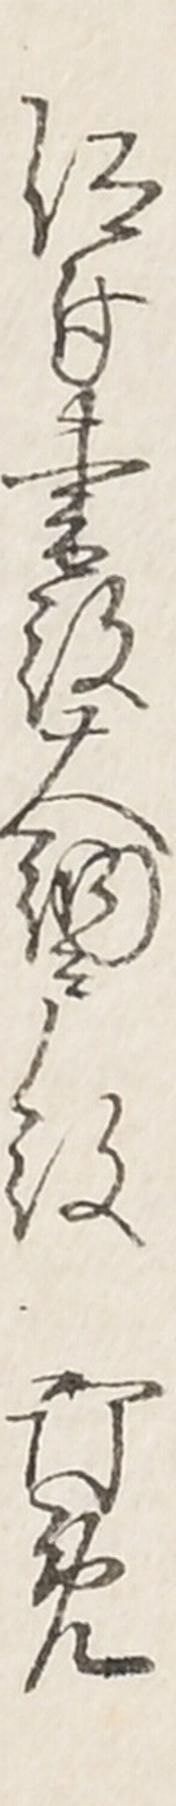仰付書役大納戸役御免
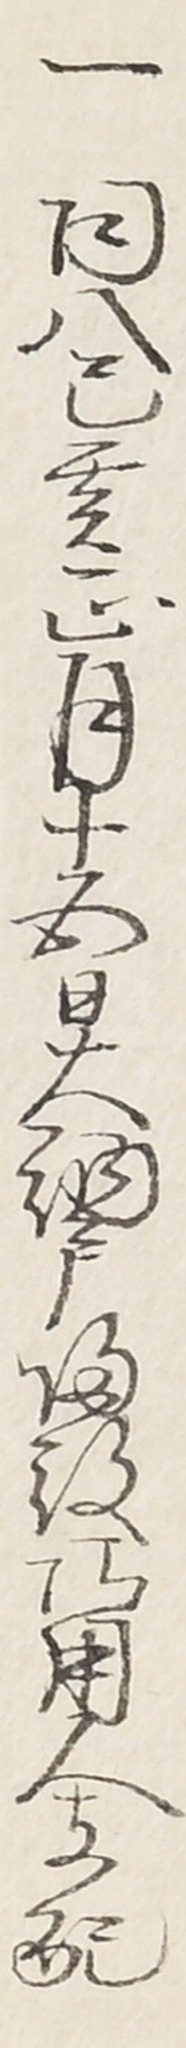一同八己亥正月十五日大納戸帰役御用人支配
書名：無足諸士勤仕録（四）
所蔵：伊那市立高遠町図書館・合同会社AMANE
